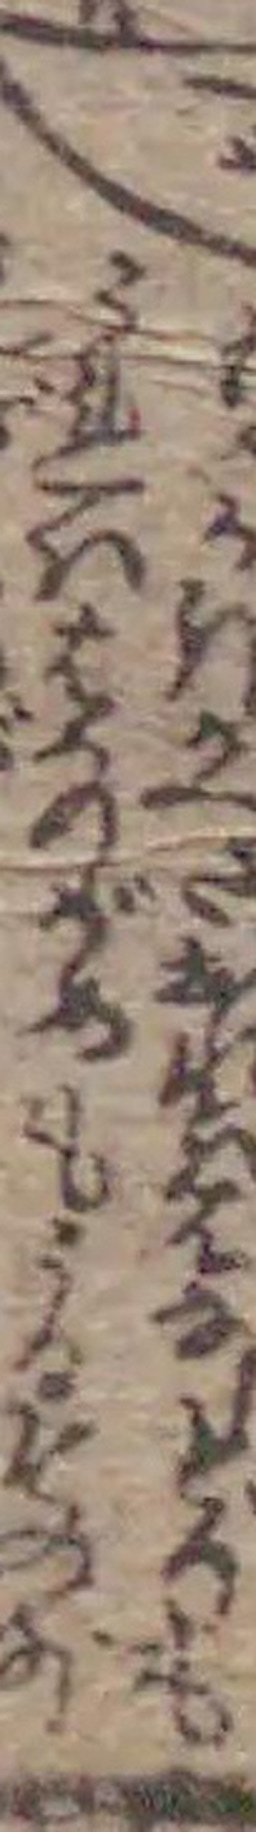うれははつのがめもうるその前
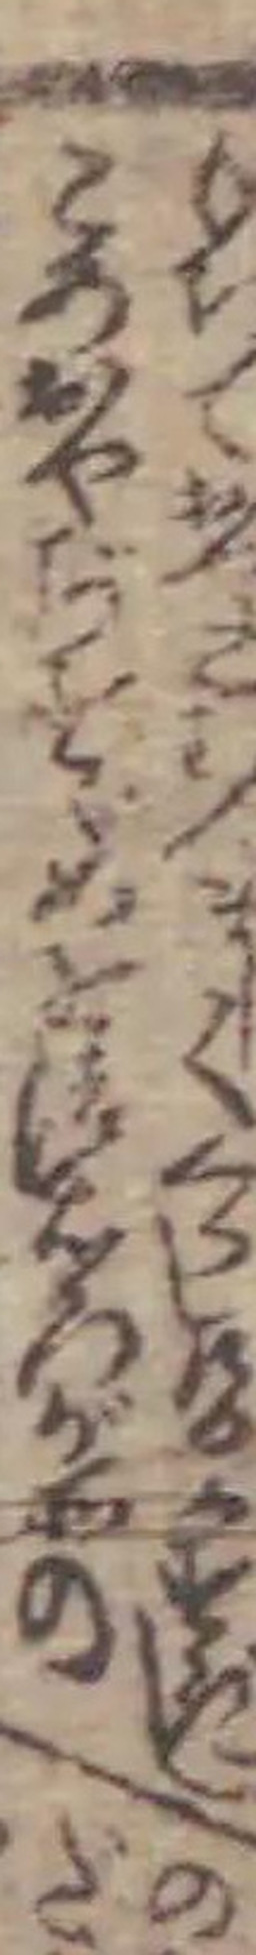ころおやぢすゞめを清右エ門が所の
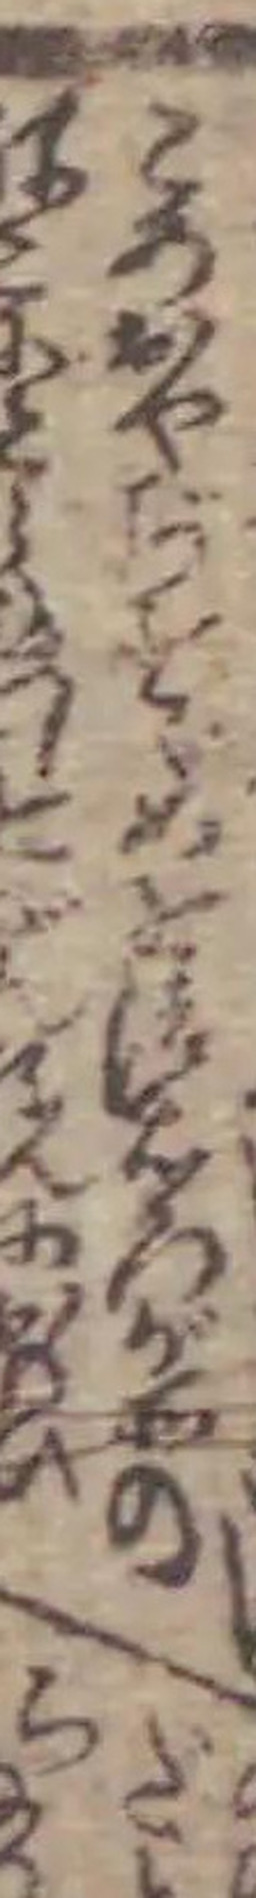ねこにとられしをざんねんにおもひ
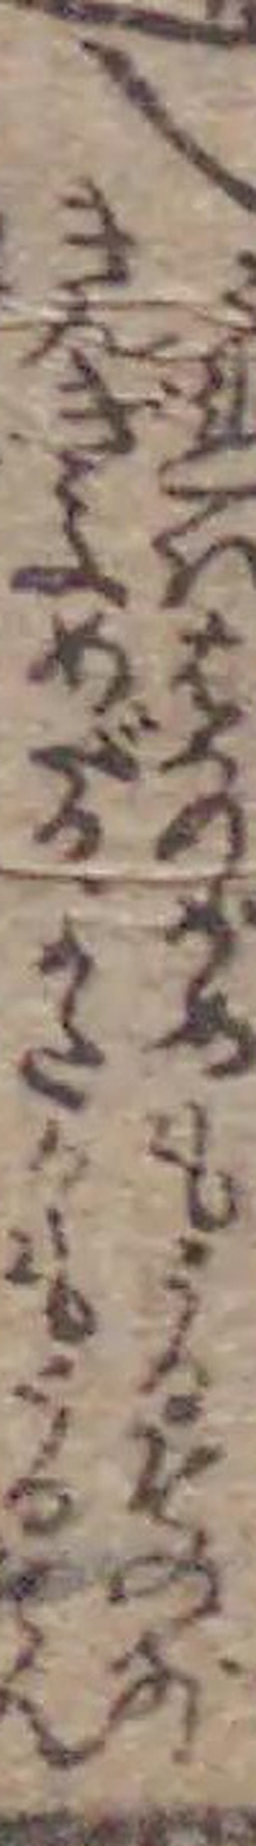きんぎよめだかよたかもくるそん
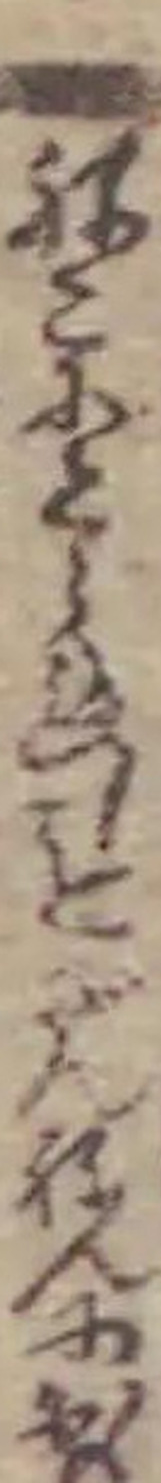ねこにとられしをざんねんにおもひ
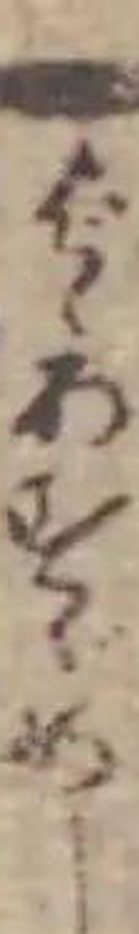ばゝあすゞめ
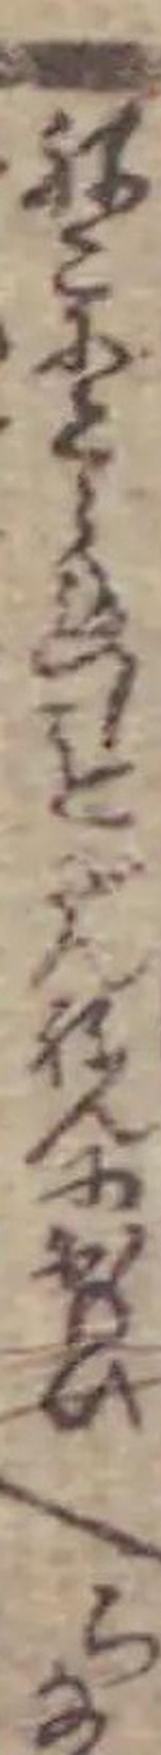ねこにとられしをざんねんにおもひ
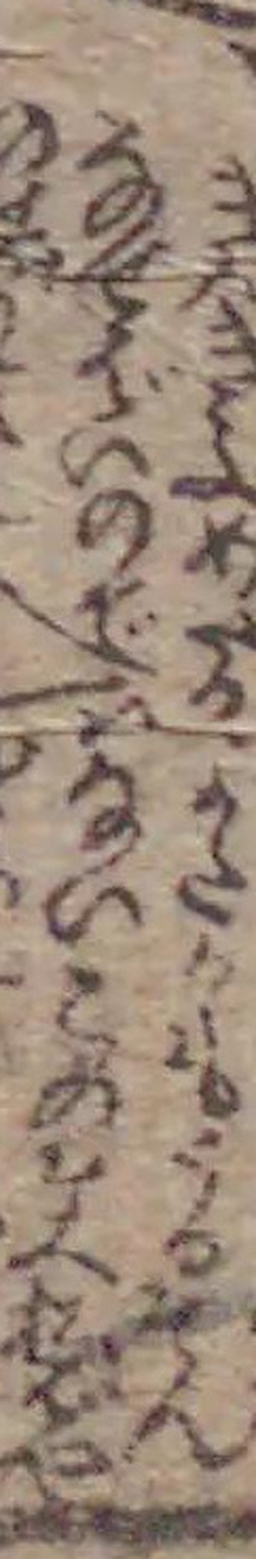なせばいのではないこのまへ松ばや
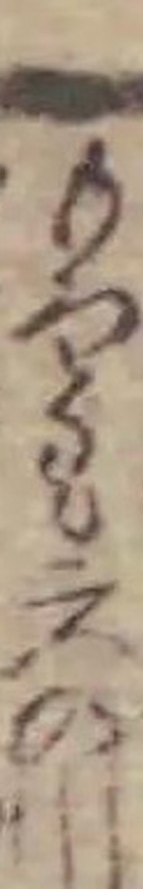もつとも二人の
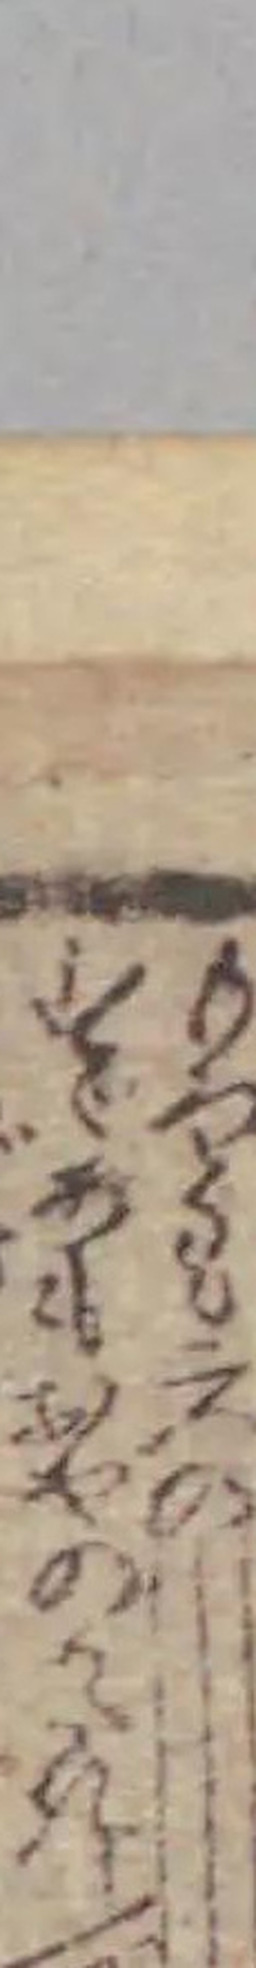すゞめもおやのかたき
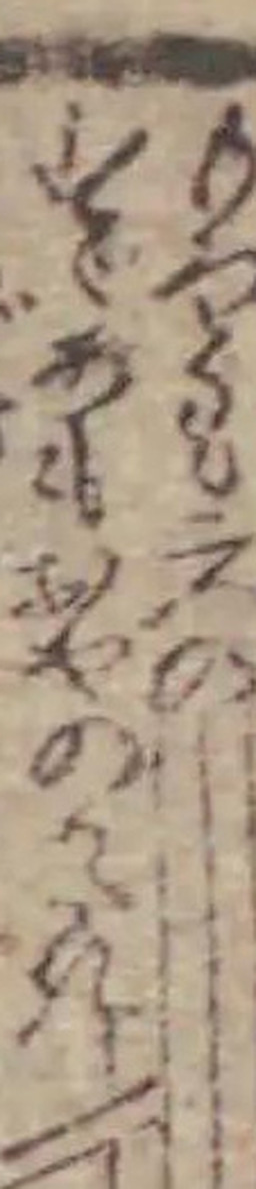すゞめもおやのかたき
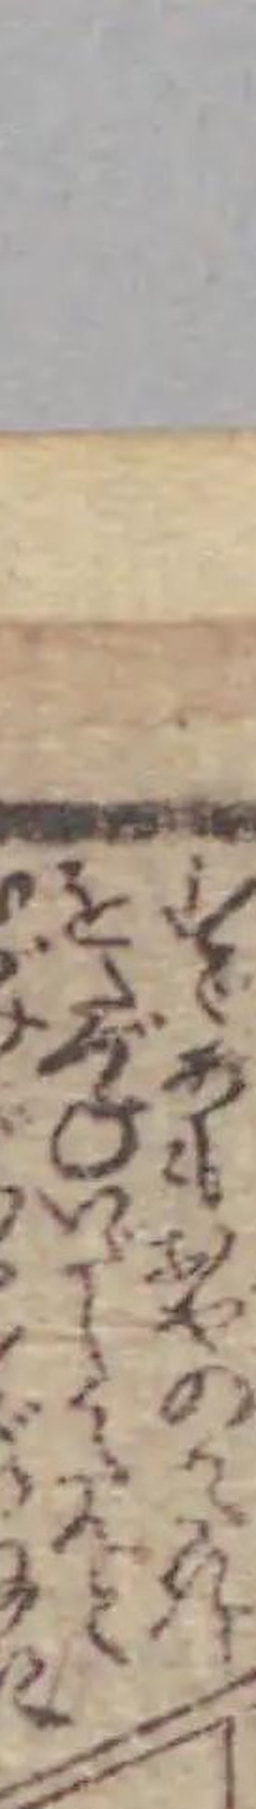をたづねいだしうたんと
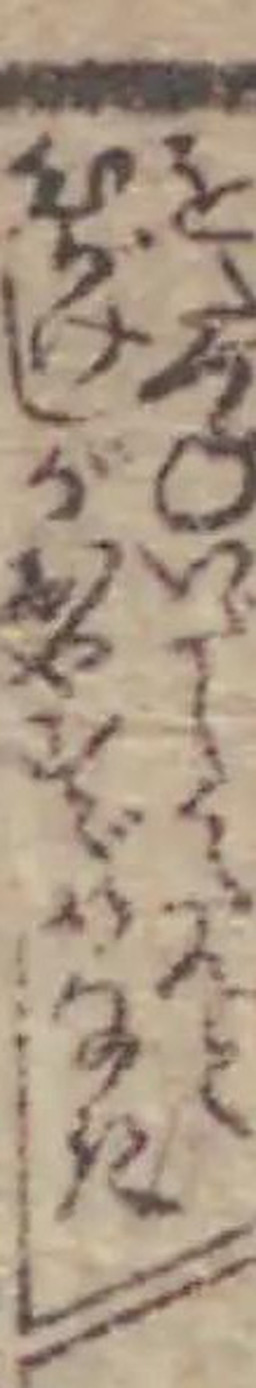心がけしがおやすゞめなき
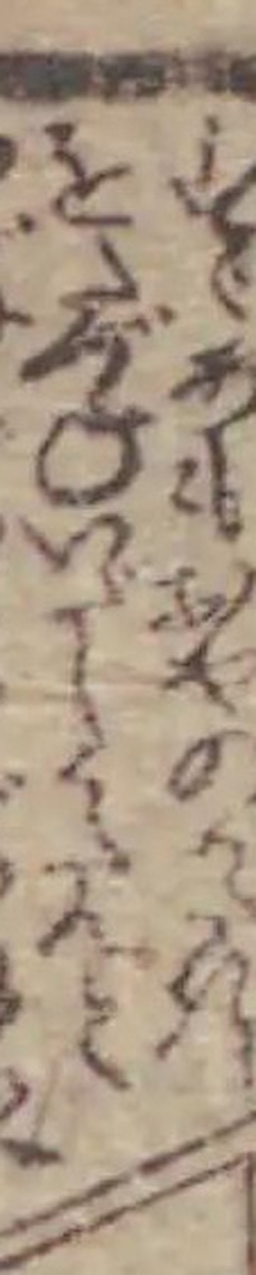をたづねいだしうたんと
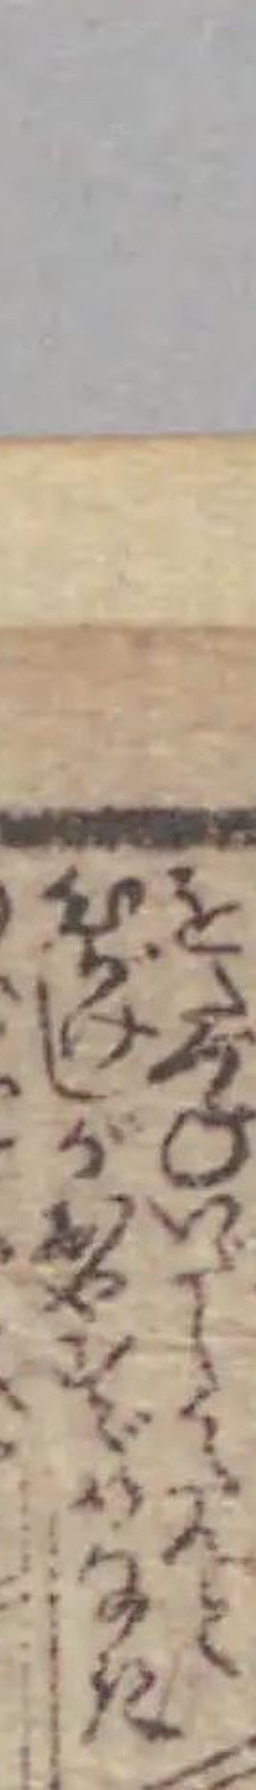心がけしがおやすゞめなき
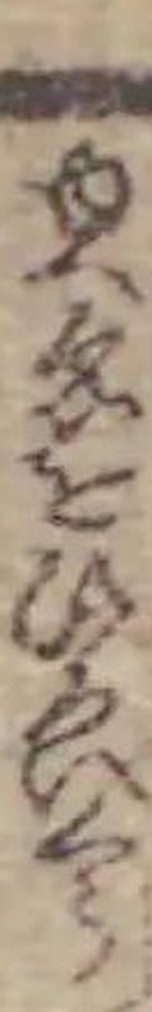ゆへゑをひろいくう
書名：冷水灰毛猫 2巻
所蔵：国立国会図書館 National Diet Library, JAPAN
